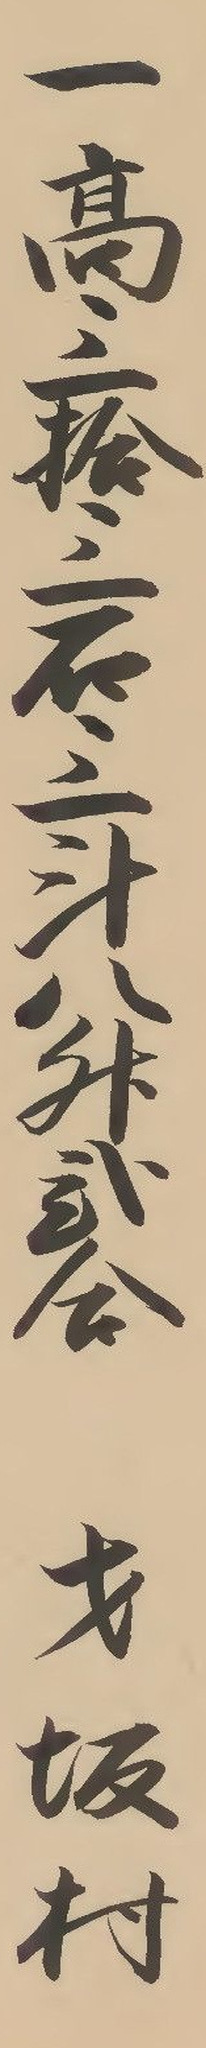一高三拾三石三斗八升弐合才坂村
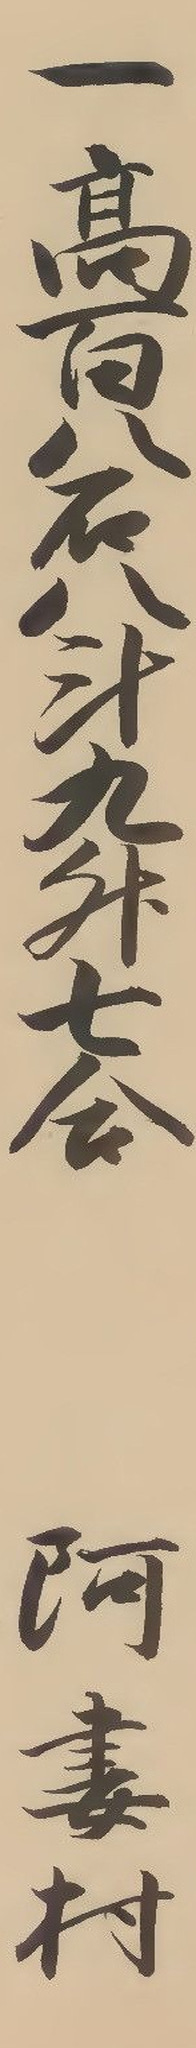一高百八石八斗九升七合阿妻村
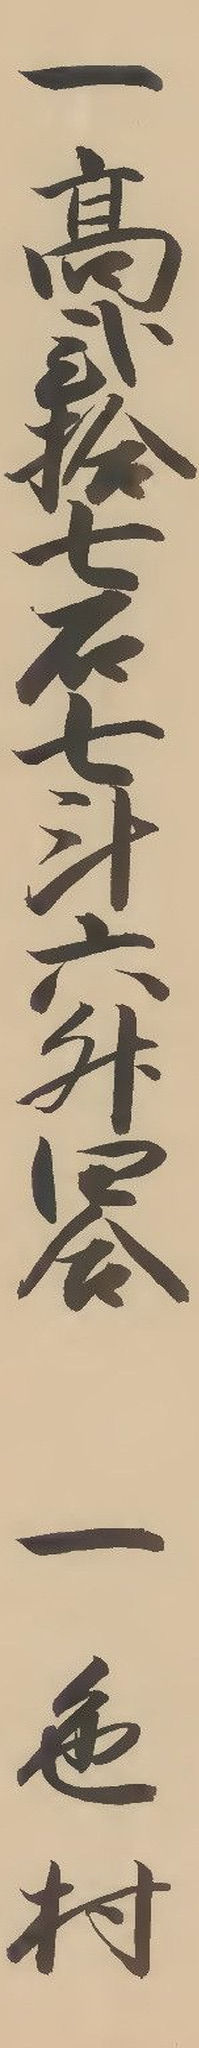一高弐拾七石七斗六升四合一色村

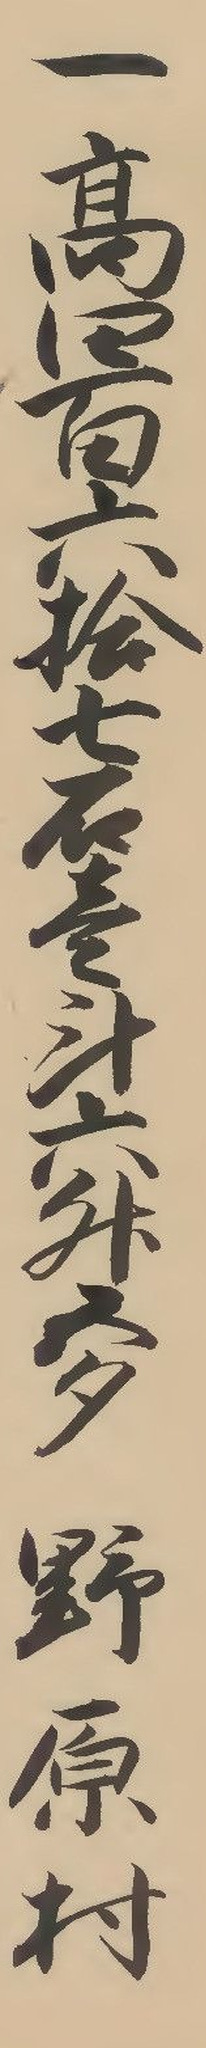一高四百六拾七石壱斗六升五勺野原村
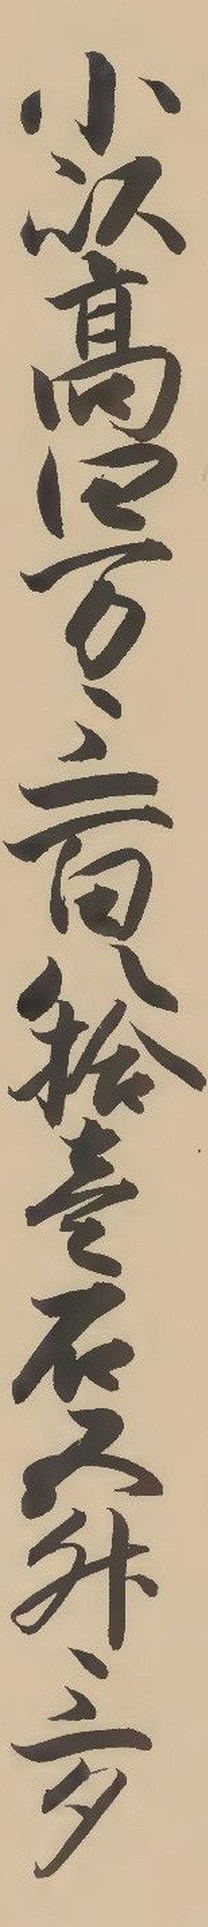小以高四万三百八拾壱石五升三勺
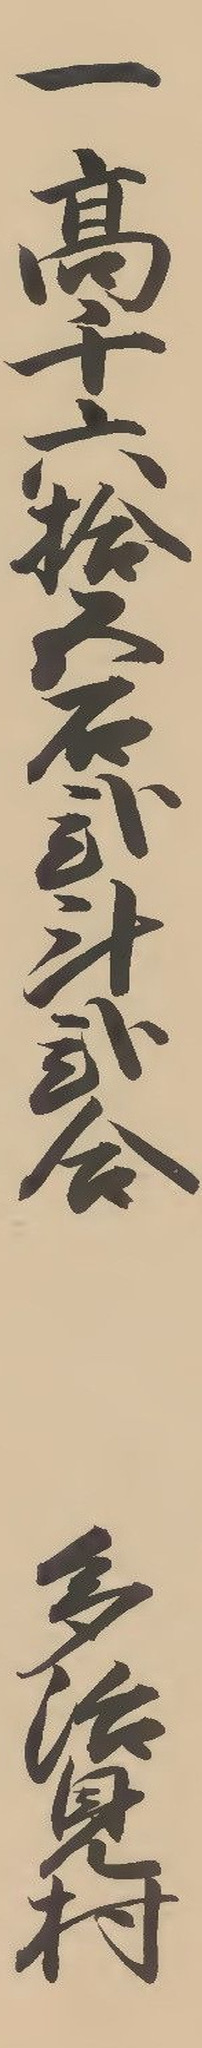一高千六拾五石弐斗弐合多治見村
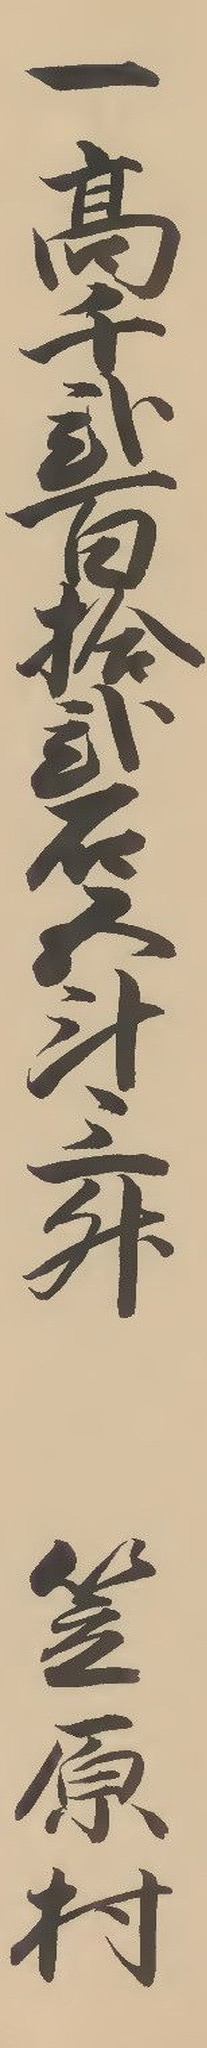一高千弐百拾弐石五斗三升笠原村
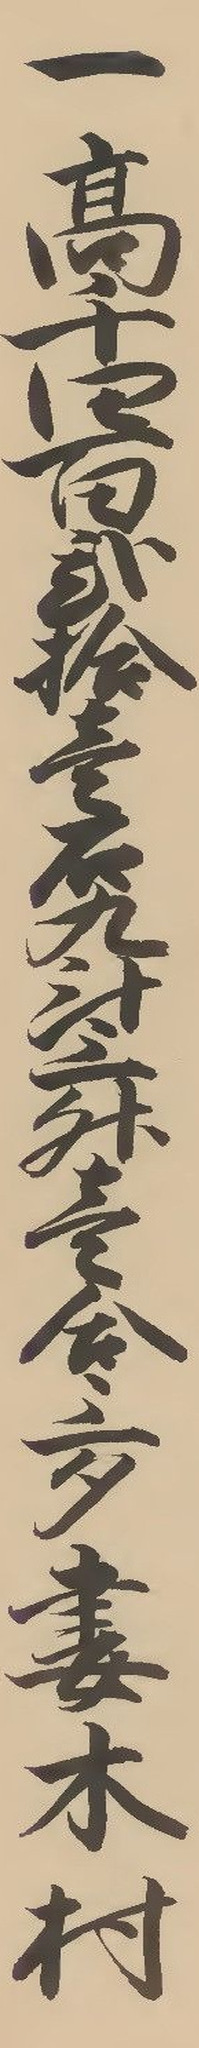一高千四百弐拾壱石九斗三升壱合三勺妻木村

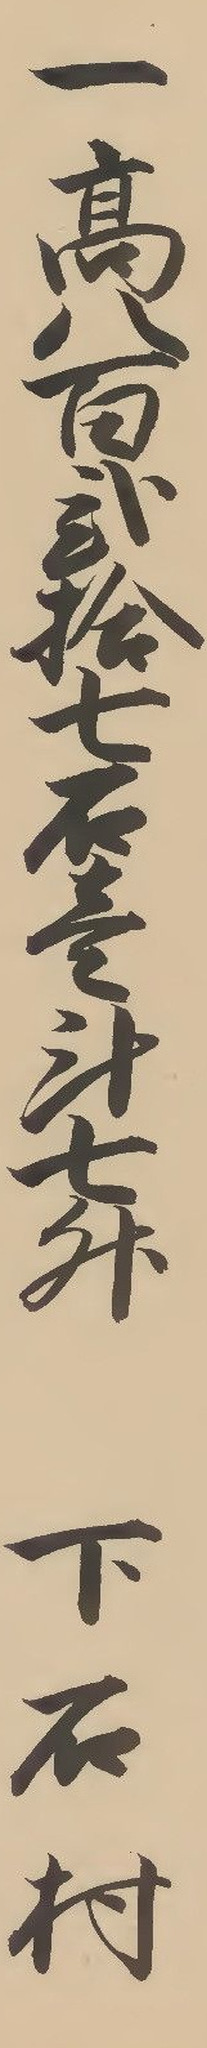一高八百弐拾七石壱斗七升下石村
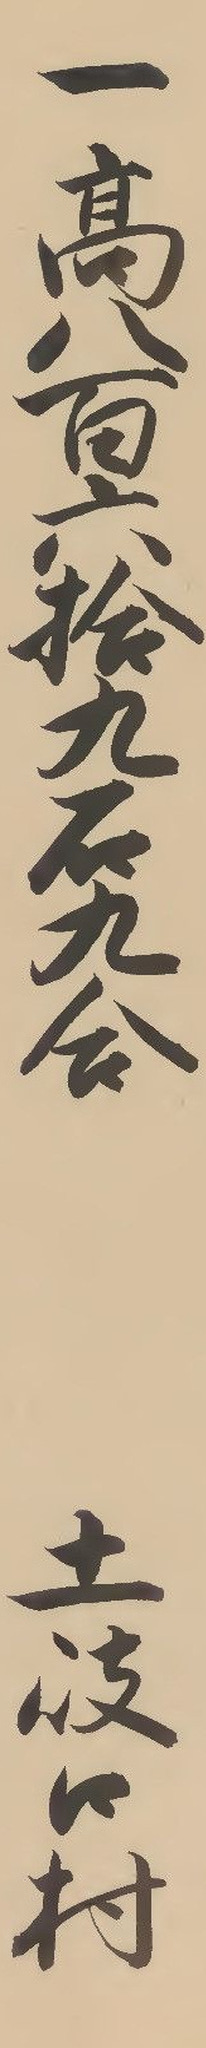一高八百六拾九石九合土岐口村
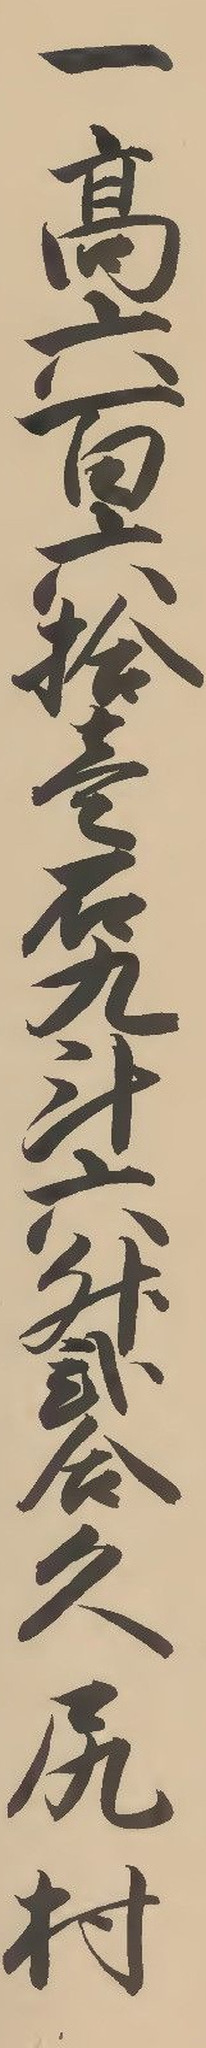一高六百六拾壱石九斗六升弐合久尻村
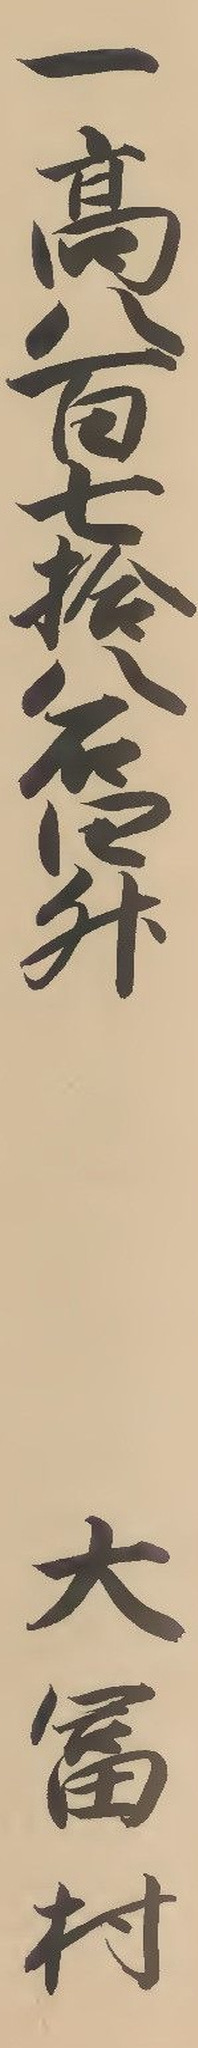一高八百七拾八石四升大富村
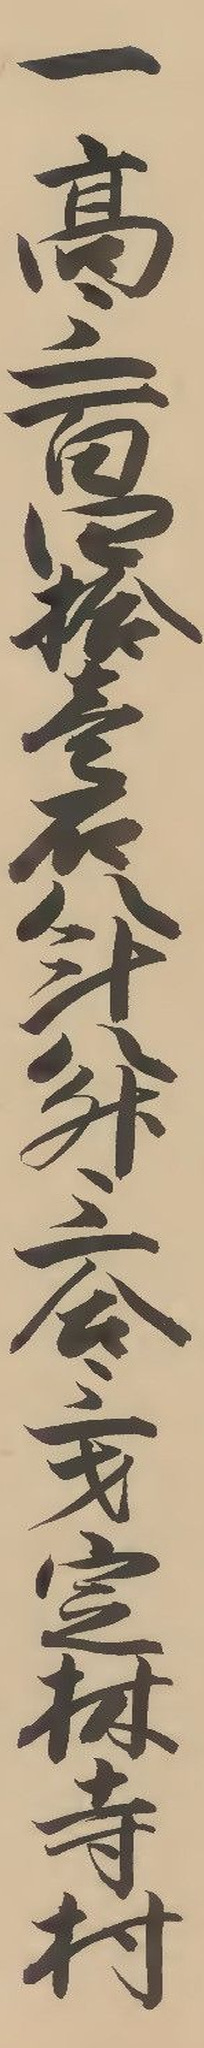一高三百四拾壱石八斗八升三合三才定林寺村
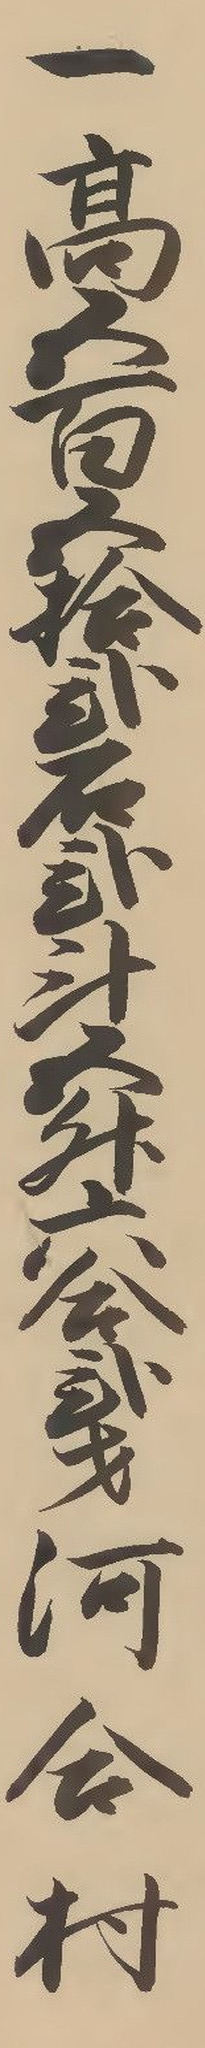一高五百五拾弐石弐斗五升六合弐才河合村
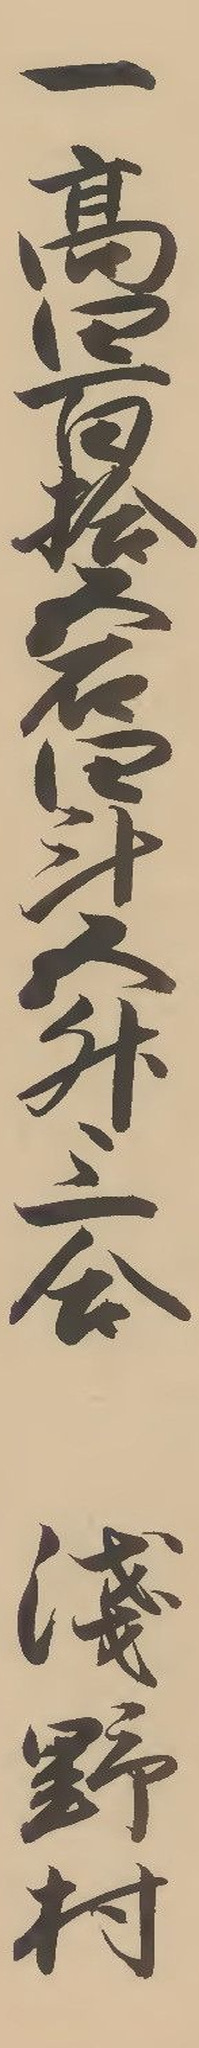一高四百拾五石四斗五升三合浅野村

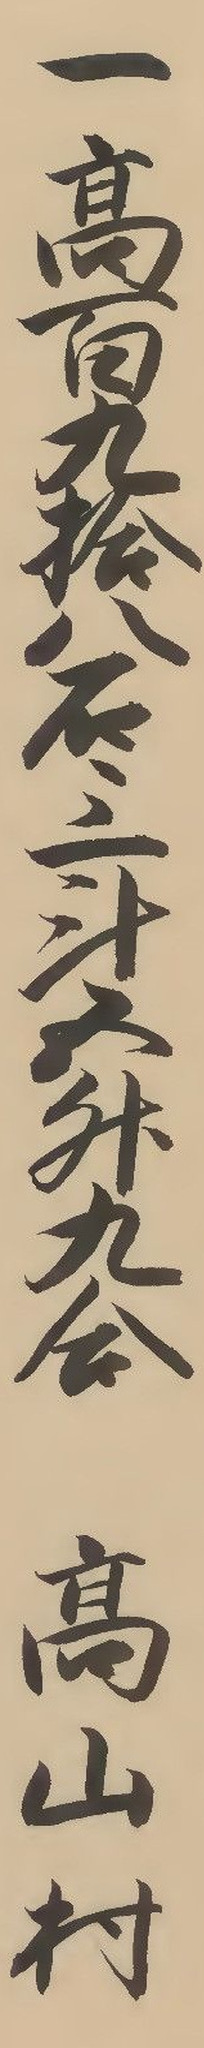一高百九拾八石三斗五升九合高山村
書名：美濃国郷帳
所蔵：国立公文書館 National Archives of Japan
